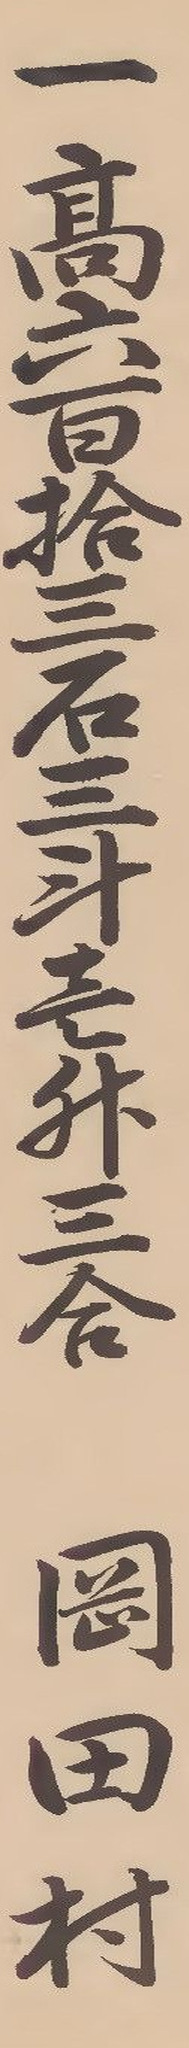一高六百拾三石三斗壱升三合岡田村
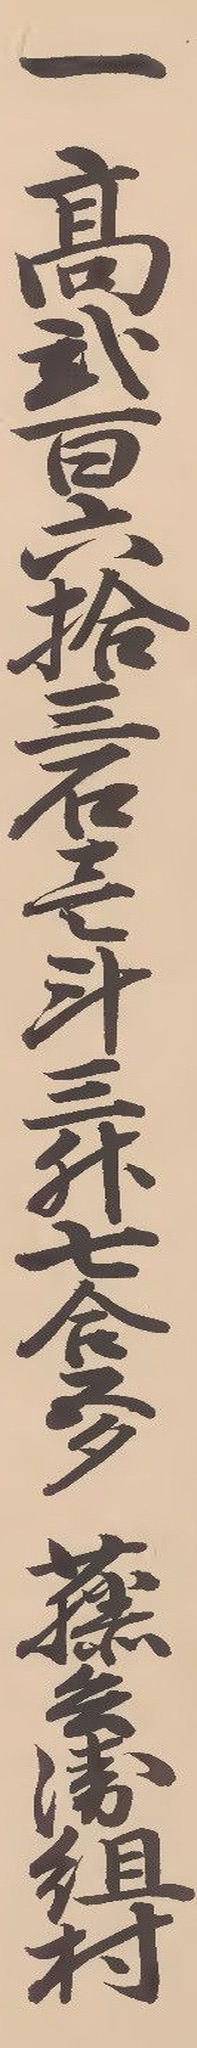一高弐百六拾三石壱斗三升七合五勺藤兵衛組村
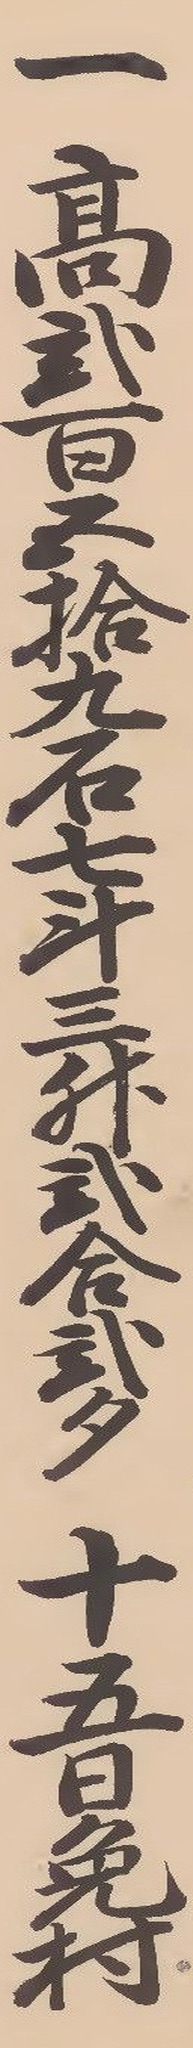一高弐百五拾九石七斗三升弐合弐勺十五日免村
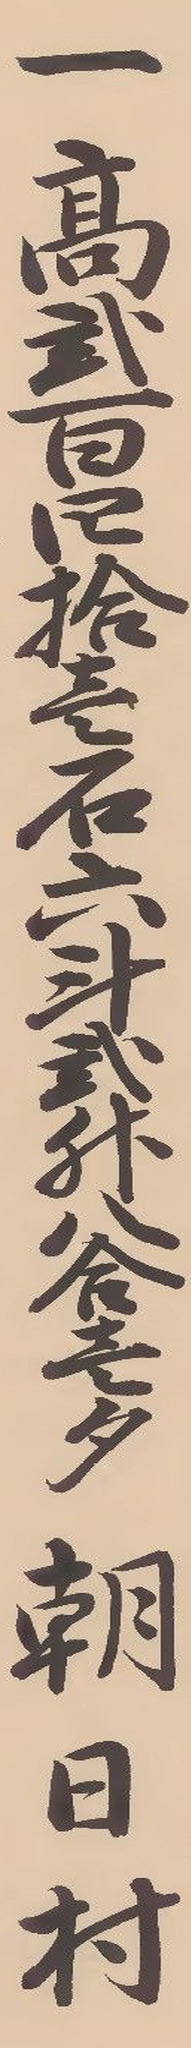一高弐百四拾壱石六斗弐升八合壱勺朝日村
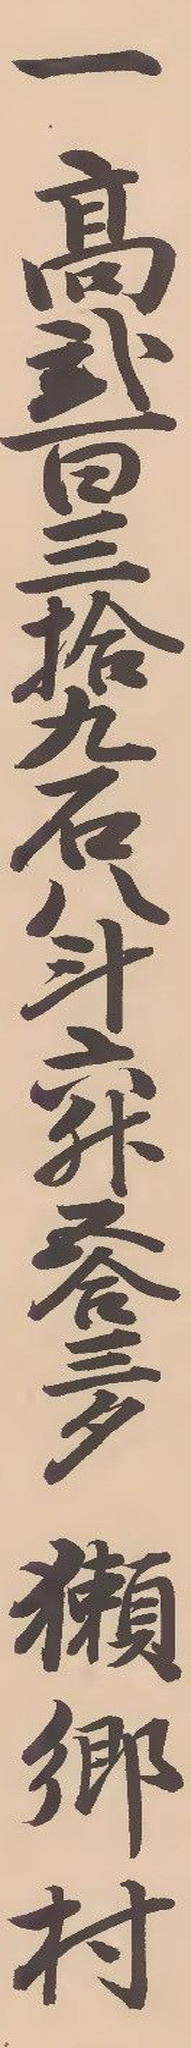一高弐百三拾九石八斗六升五合三勺獺郷村

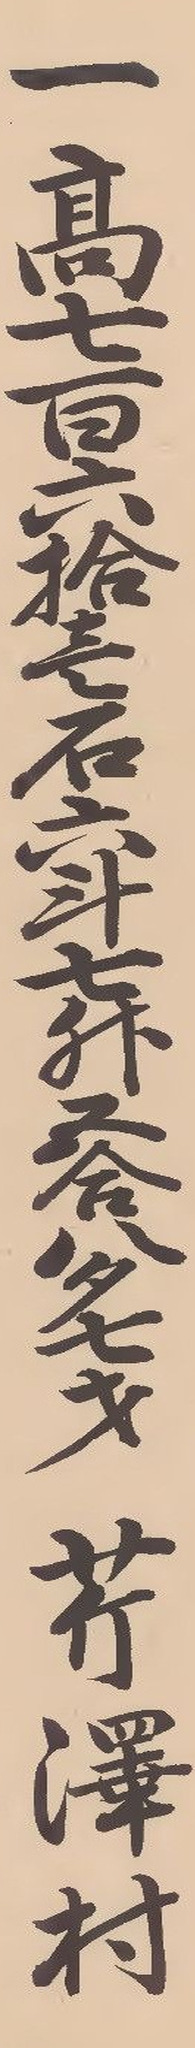一高七百六拾壱石六斗七升五合八勺七才芹澤村
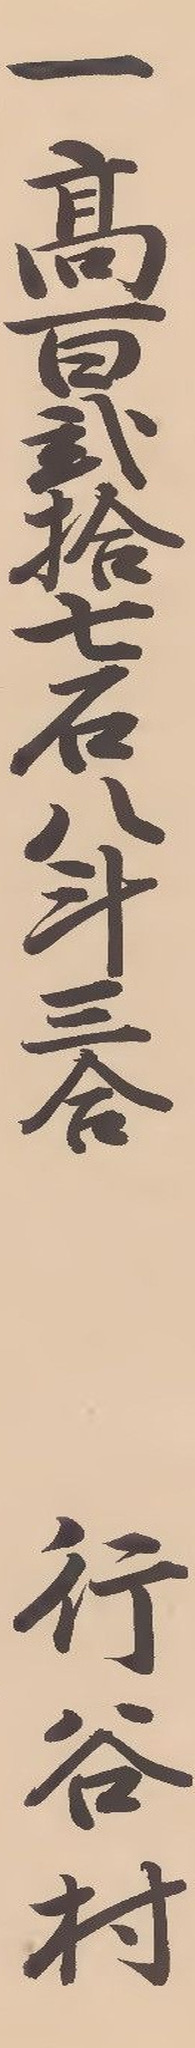一高百弐拾七石八斗三合行谷村
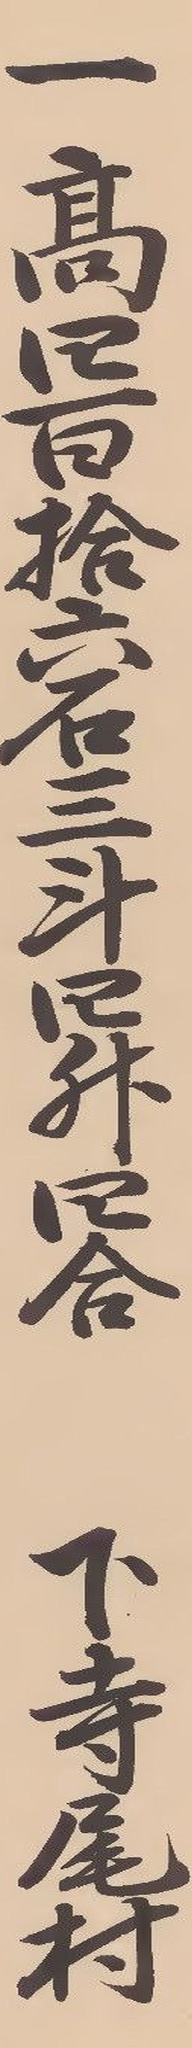一高四百拾六石三斗四升四合下寺尾村
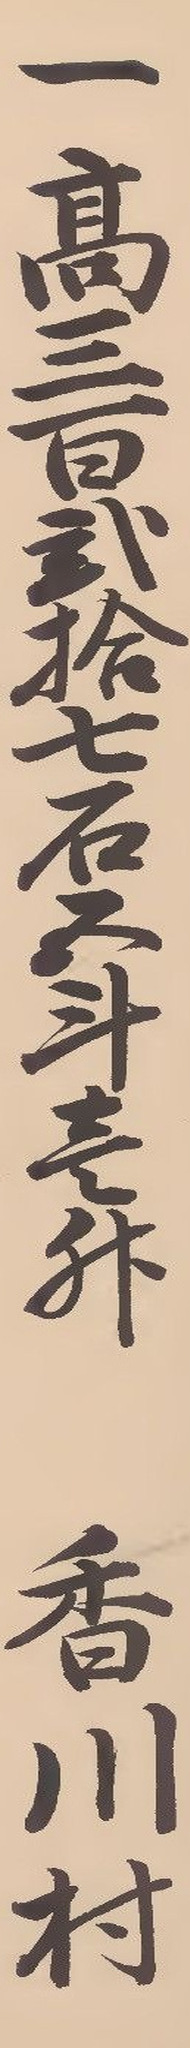一高三百弐拾七石五斗壱升香川村

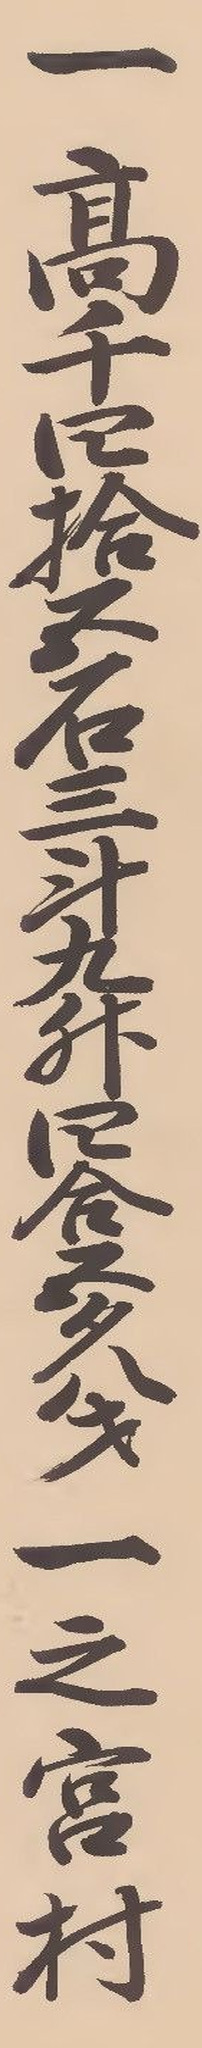一高千四拾五石三斗九升四合五勺八才一之宮村
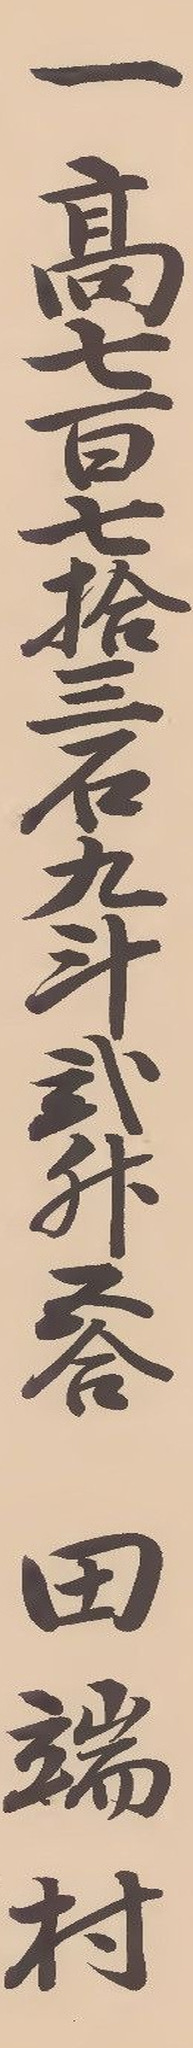一高七百七拾三石九斗弐升五合田端村
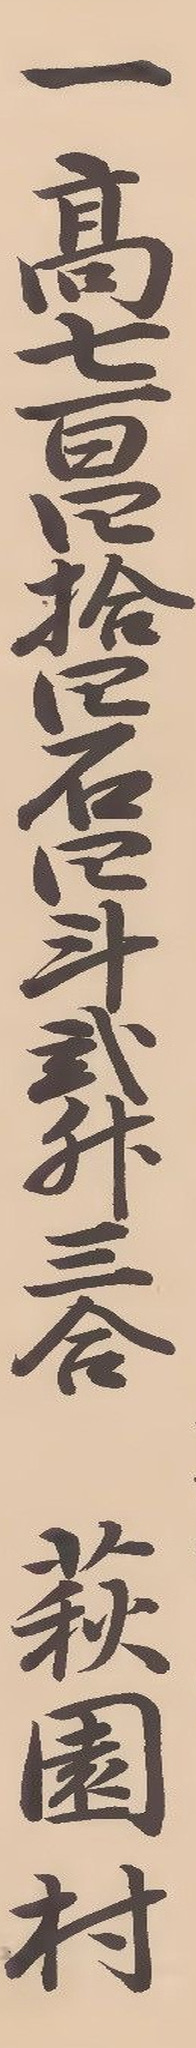一高七百拾四石四斗弐升三合萩園村
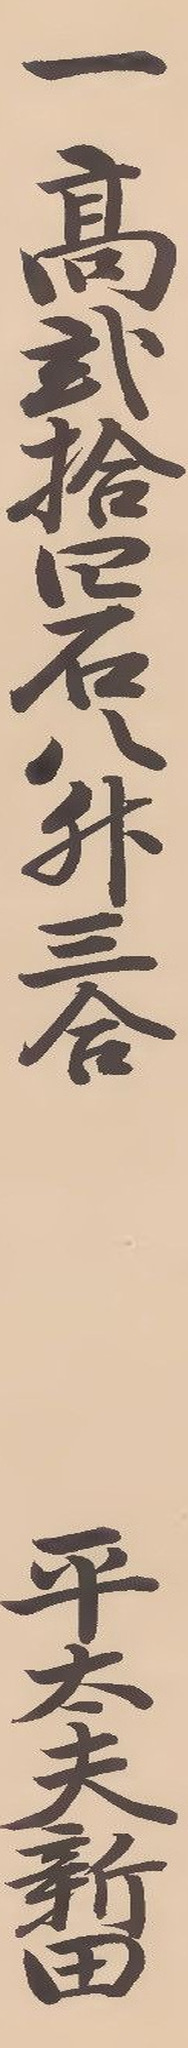一高弐拾四石八升三合平太夫新田
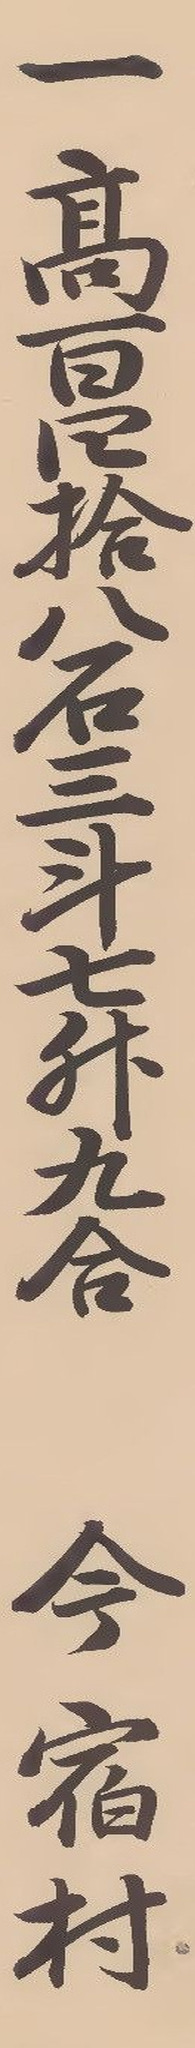一高百四拾八石三斗七升九合今宿村
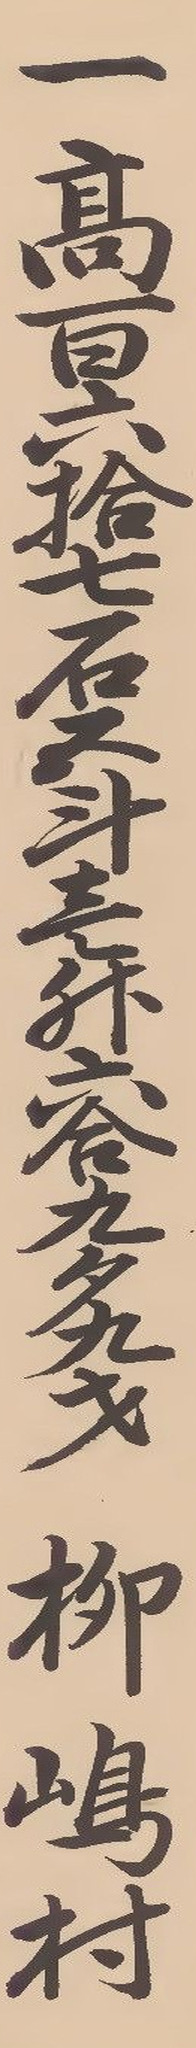一高百六拾七石五斗壱升六合九勺九才柳嶋村
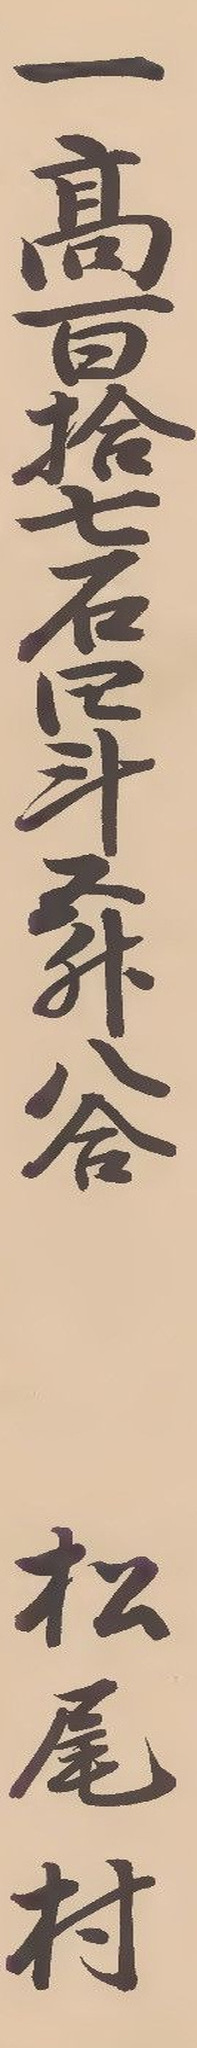一高百拾七石四斗五升八合松尾村
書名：相模国郷帳
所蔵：国立公文書館 National Archives of Japan
